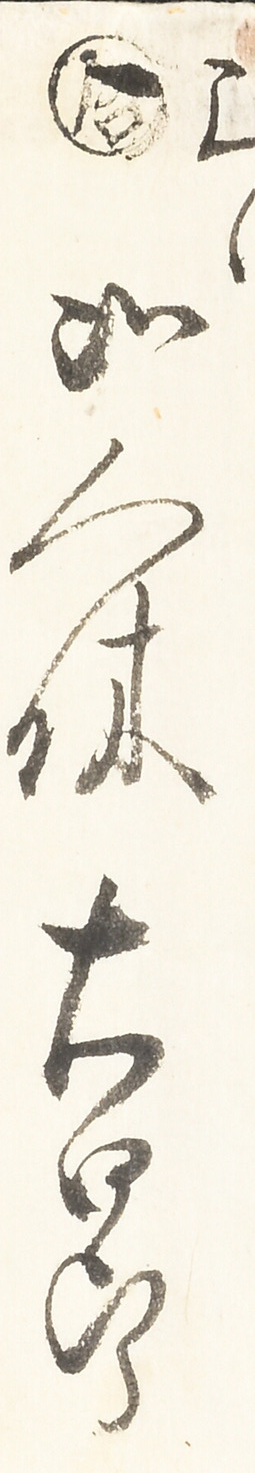一弐人休右同断
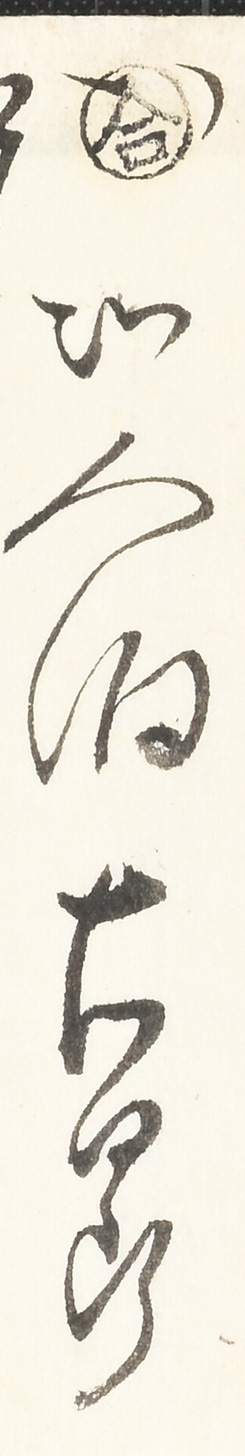一弐人泊右同断

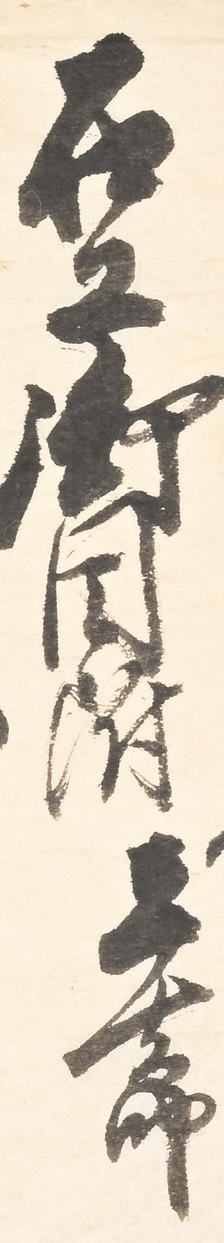石工御目附平十郎
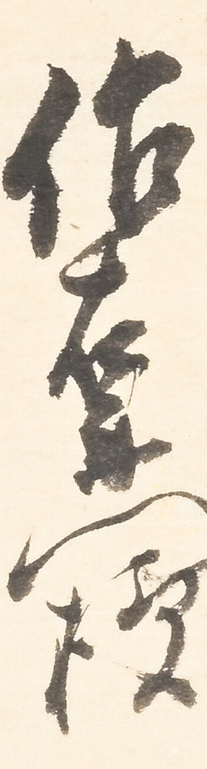作右衛門様
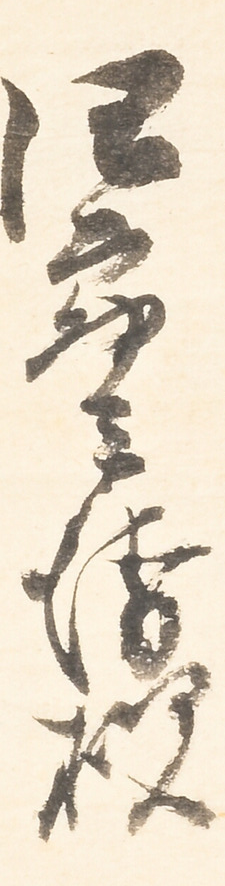四郎兵衛様
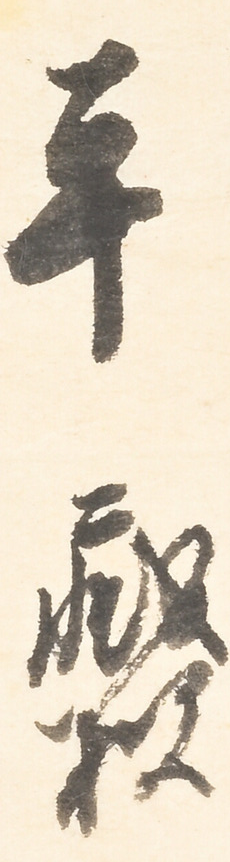平蔵様
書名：亥二月休泊小物控
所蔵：伊那市立高遠町図書館・合同会社AMANE
